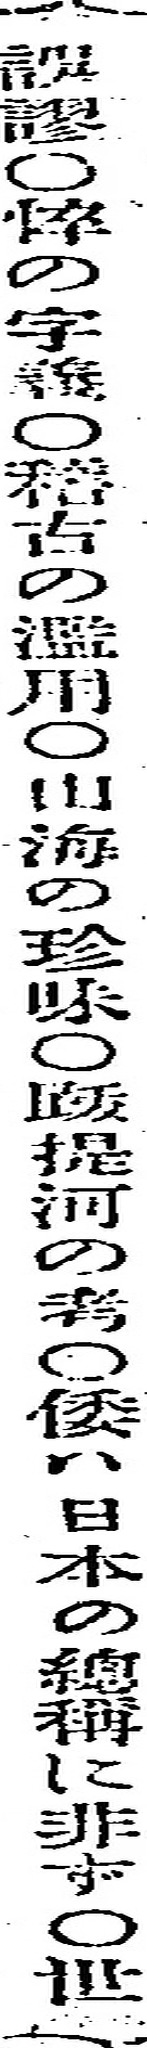誤謬〇悴の字義〇稽古の濫用〇山海の珍味〇跋提河の考〇倭は日本の総稱に非ず〇世
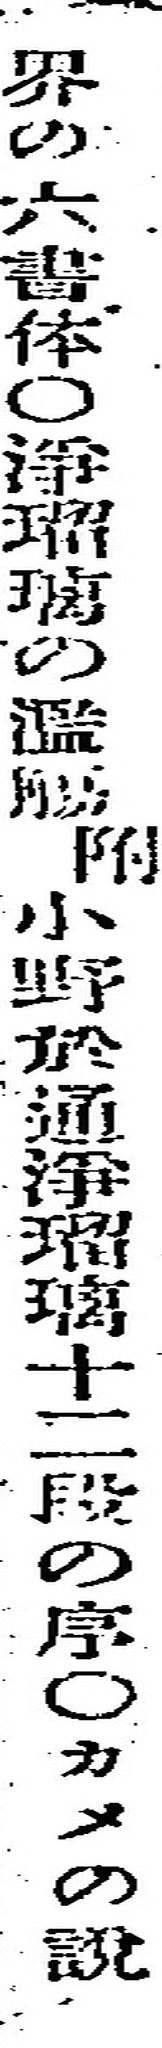界の六書体〇浄瑠璃の濫觴附小野於通浄瑠璃十二段の序〇カメの説
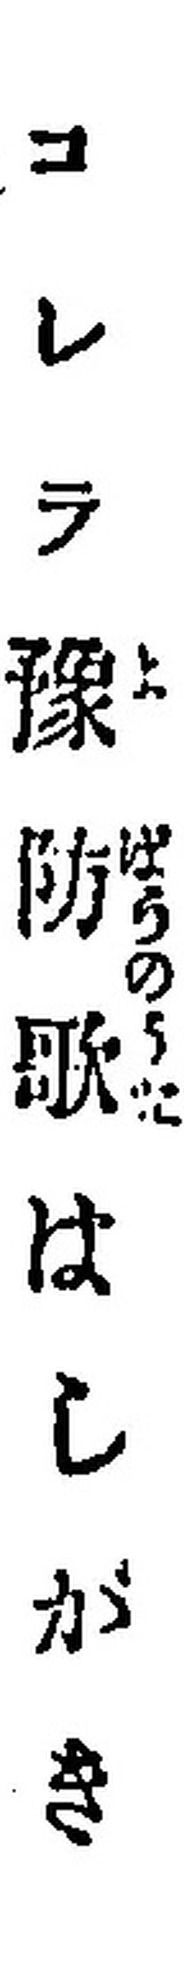コレラ豫防歌はしがき
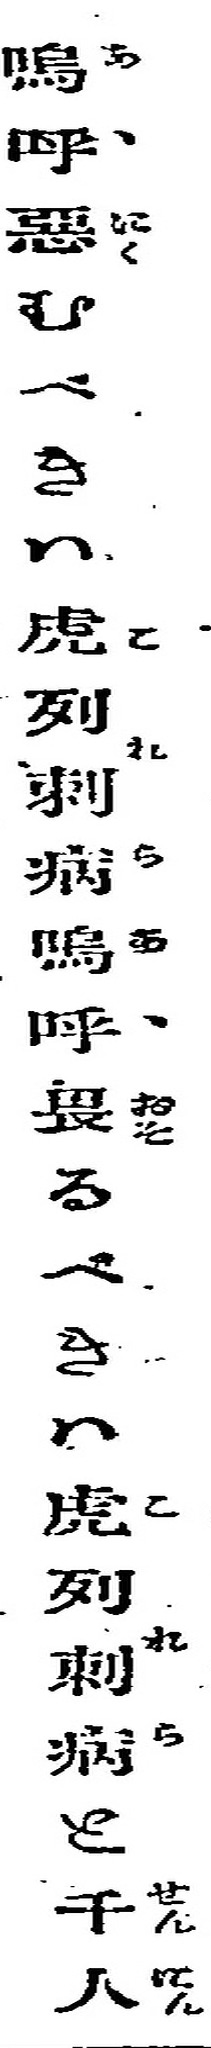嗚呼惡むべきは虎列刺病嗚呼畏るべきは虎列刺病と千人
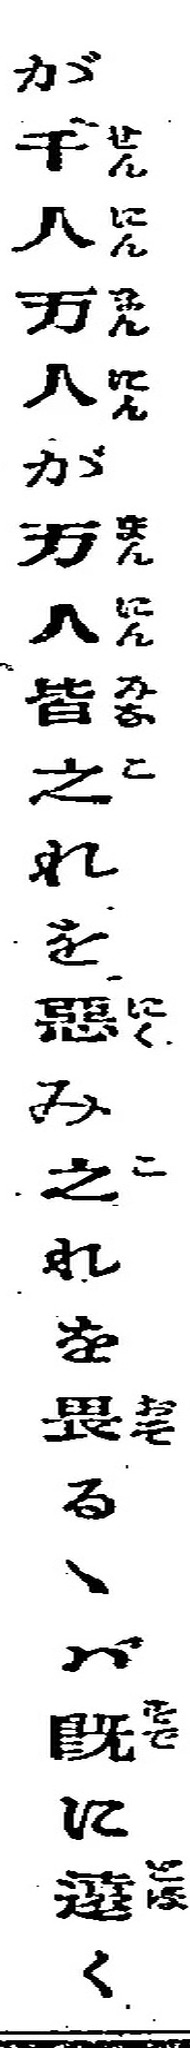が千人万人が万人皆之れを悪み之れを畏るゝば既に遠く
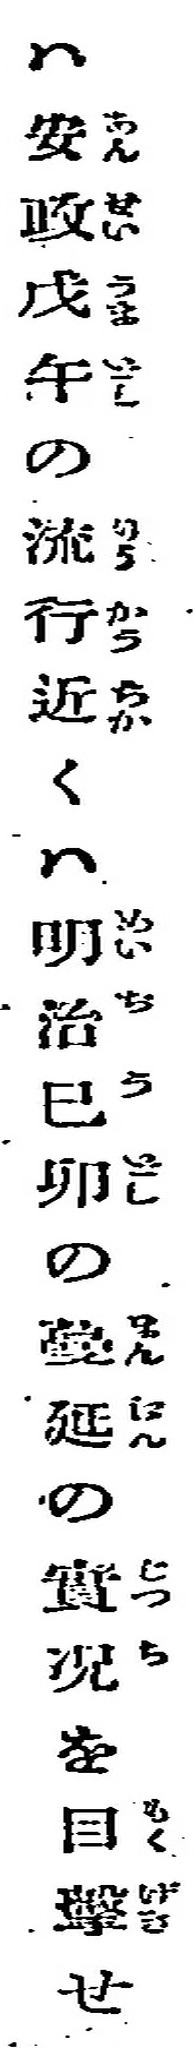は安政戌午の流行近くは明治巳卯の蔓延の実況を目撃せ
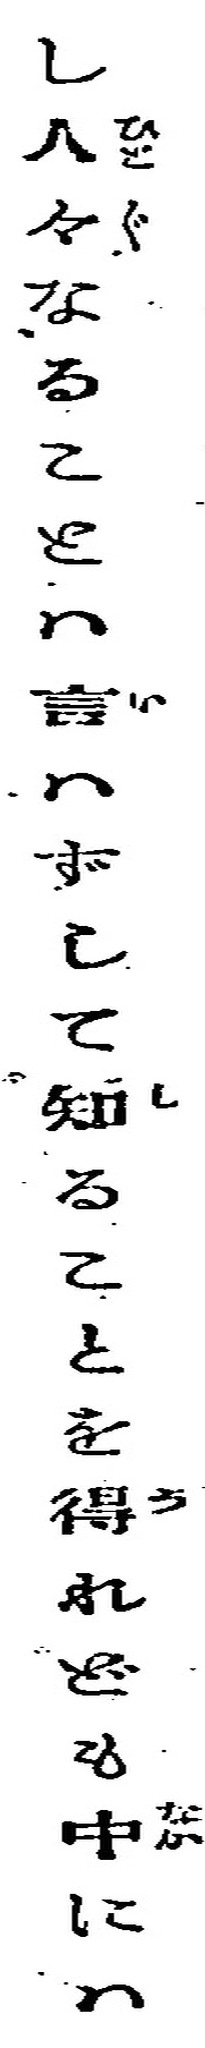し人々なることは言はずして知ることを得れども中には
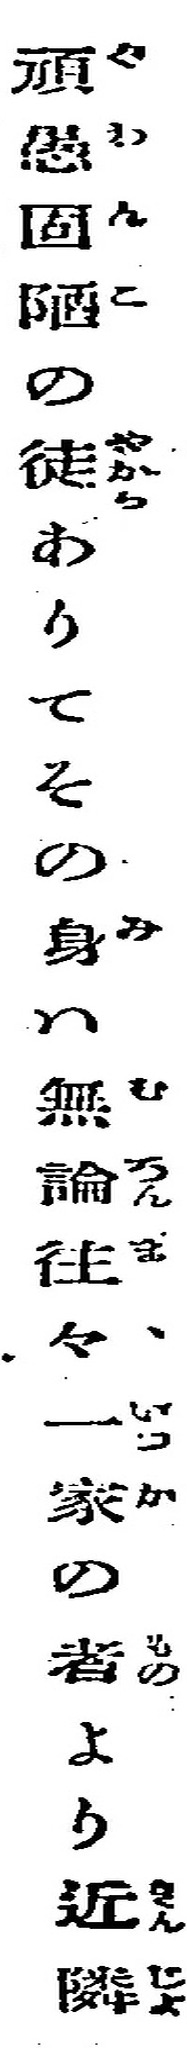頑愚固陋の徒ありてその身は無論往々一家の者より近隣
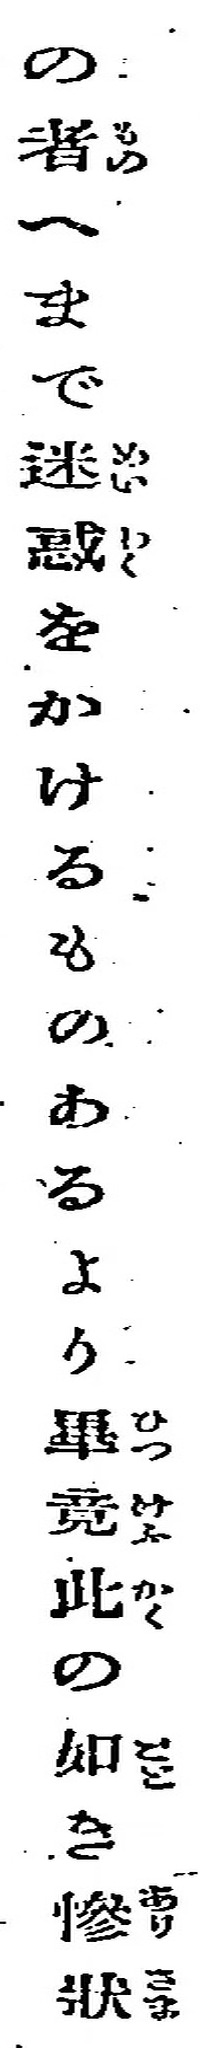の者へまで迷惑をかけるものあるより畢竟此の如き惨状
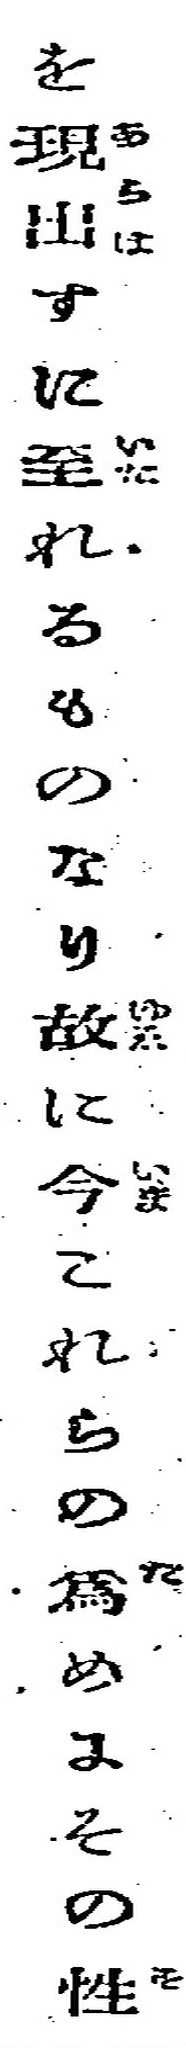を現出すに至れるものなり故に今これらの為めにその性
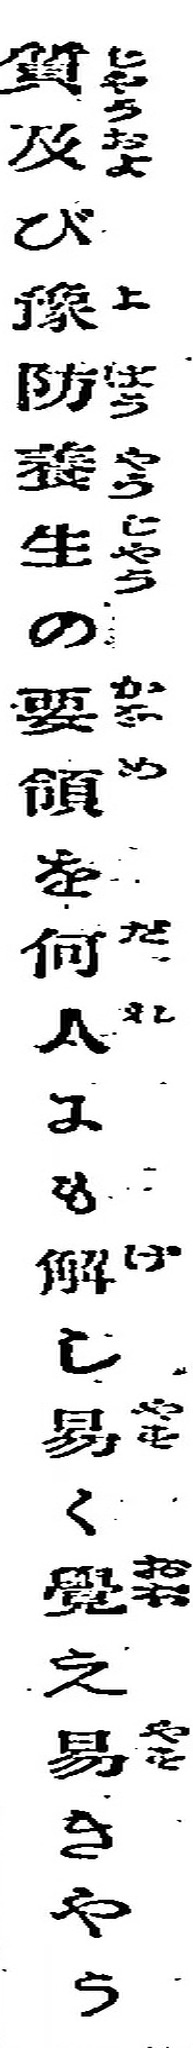質及び豫防養生の要領を何人みの解し易く覚え易きやう

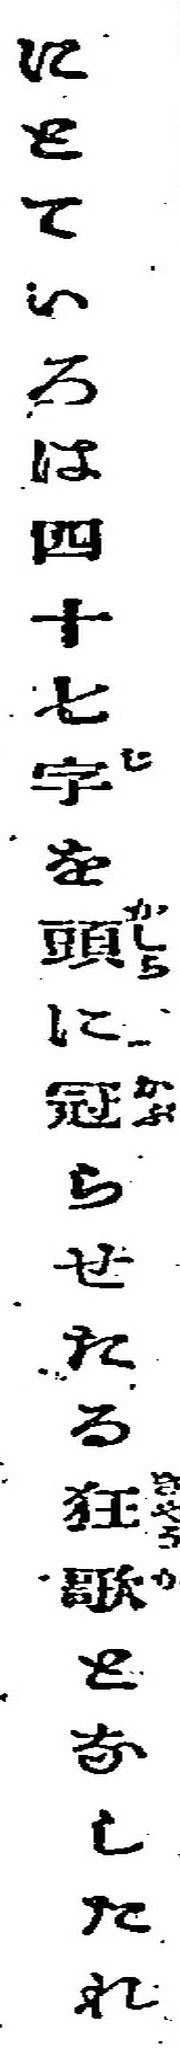にとていろは四十七字を頭に冠らせたる狂歌となしたれ
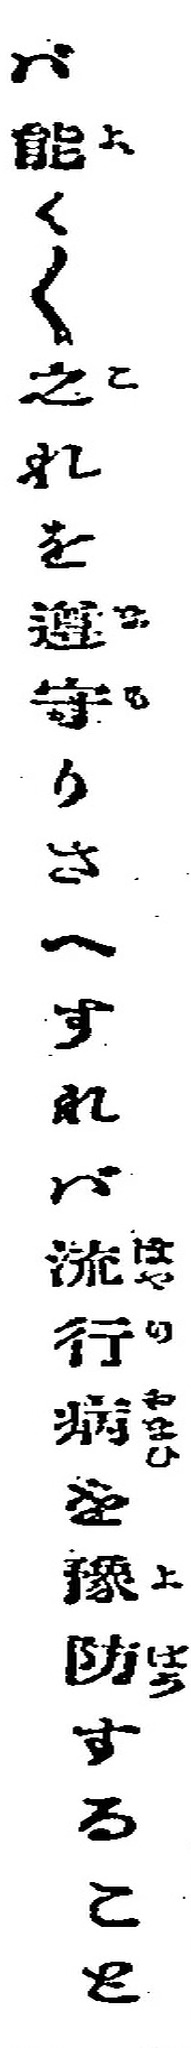は能く〳〵之れを遵守りさへすれば流行病を豫防すること
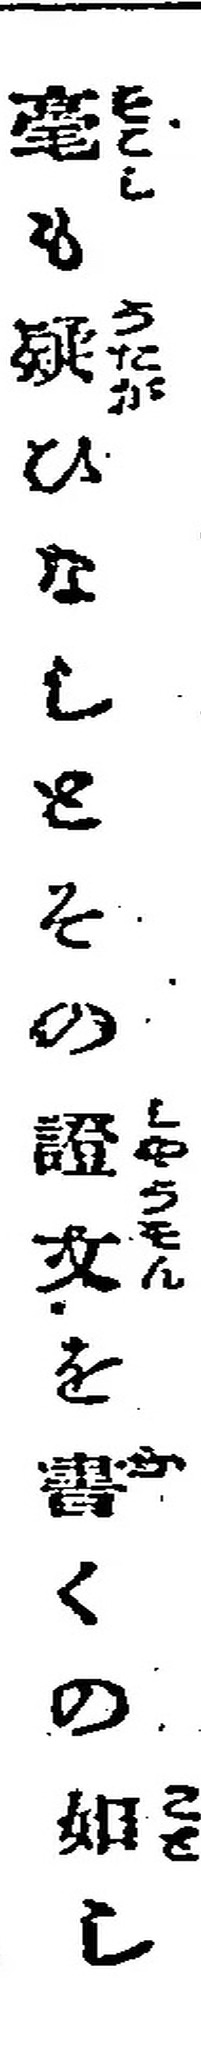毫も疑ひなしとその證文を書くの如し
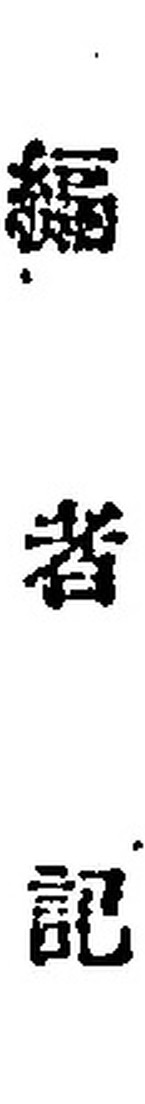編者記
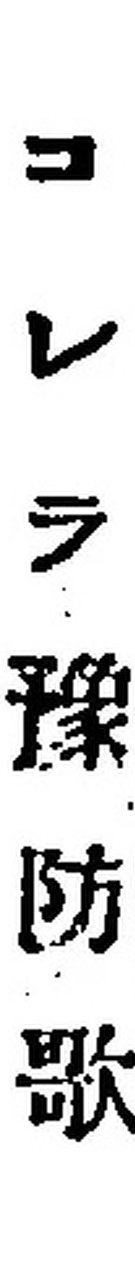コレラ豫防歌
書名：新撰暑中養生法 : 附・コレラ予防歌
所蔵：国立国会図書館 National Diet Library, JAPAN
